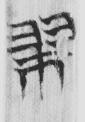{羽巿}
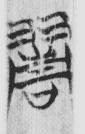{羽青}
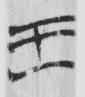王
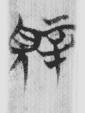親
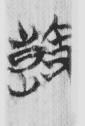鼓
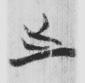之
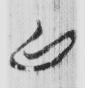㠯（以）
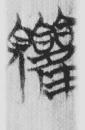觀
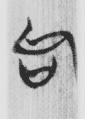句
